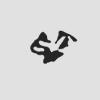興
